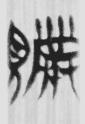{見厂菐}
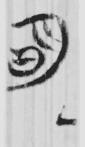明
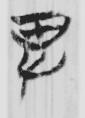卑
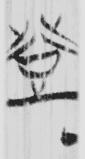登
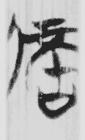俖
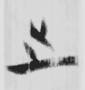之
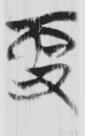{卞又}
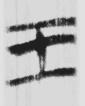王
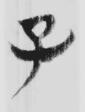子
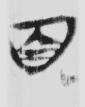百
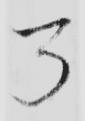乃
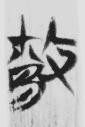{尒白水攴}
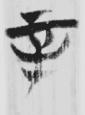辛
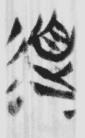道
